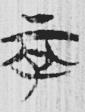○（勉）
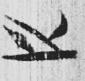之
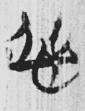○（過）
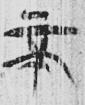不
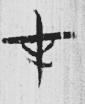才（在）
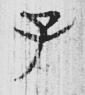子
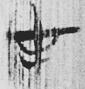才（在）
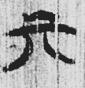亓（期）
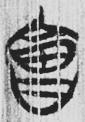會
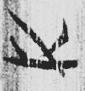之
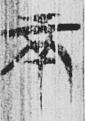不
